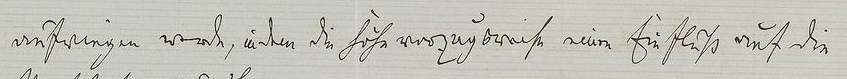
aufwiegen werde, indem die Höhe vorzugsweise einen Einfluß auf die
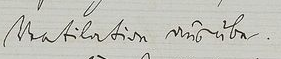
Ventilation ausübe.
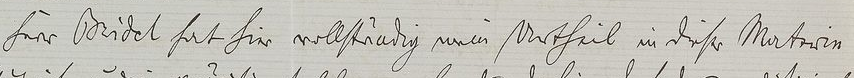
Herr Bridel hat hier vollständig mein Urtheil in dieser Materie
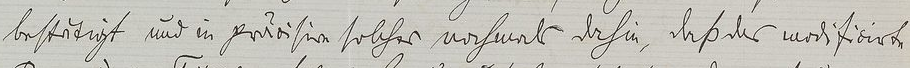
bestätigt und in Präcision solches nochmals dahin, daß das modificirte
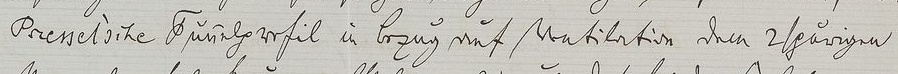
Pressel'sche Tunnelprofil in Bezug auf Ventilation dem 2spurigen
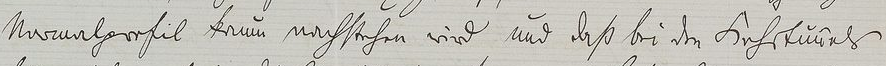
Normalprofil kaum nachstehen wird und daß bei den Kehrtunnels
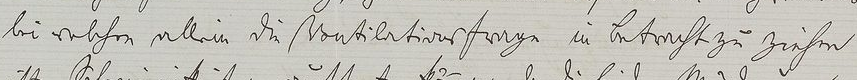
bei welchen allein die Ventilationsfrage in Betracht zu ziehen
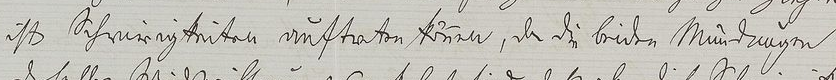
ist, Schwierigkeiten auftreten können, da die beiden Mündungen
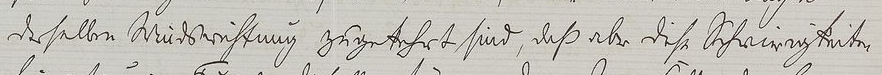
derselben Windsrichtung zugekehrt sind, daß aber diese Schwierigkeiten
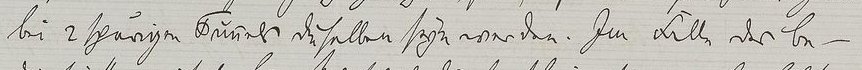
bei 2spurigen Tunnels dieselben seyn werden. Im Falle des Be-
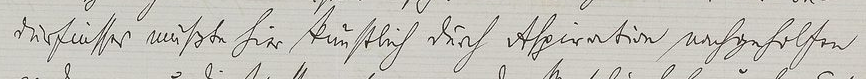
dürfnisses müßte hier künstlich durch Aspiration nachgeholfen
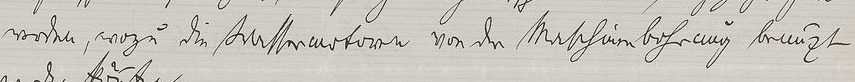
werden, wozu die Wassermotoren von der Maschinenbohrung benuzt
